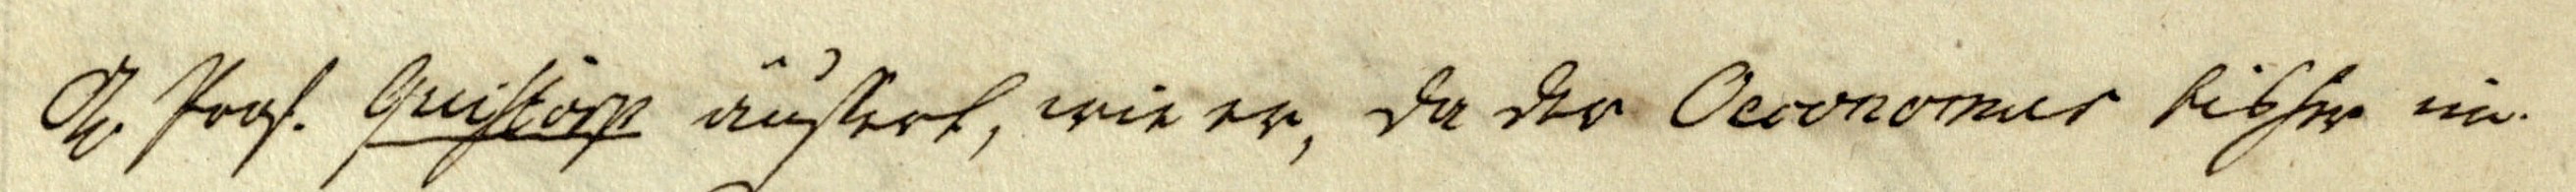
dh. Prof. Quistorp äussert, wie er, da der Oeconomus bisher im¬
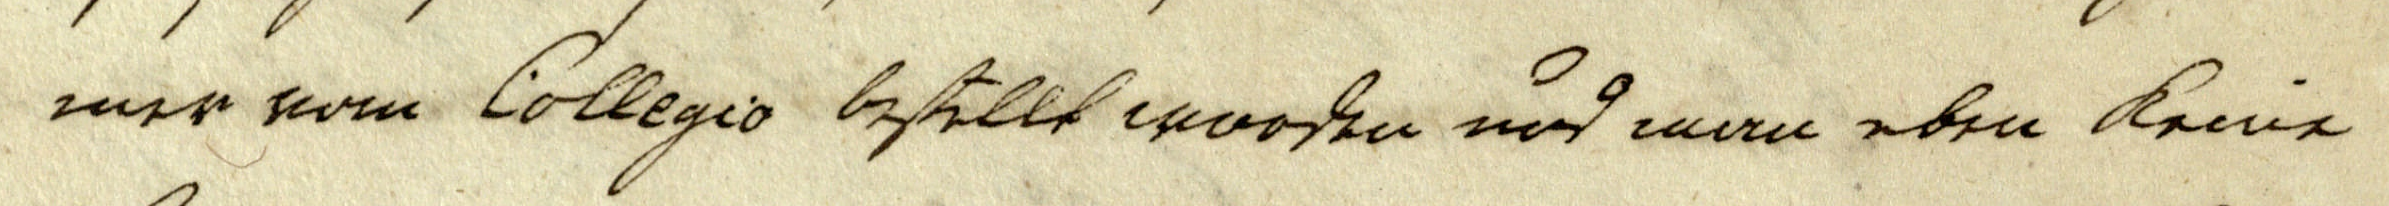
mer vom Collegio bestellt worden und man eben keine
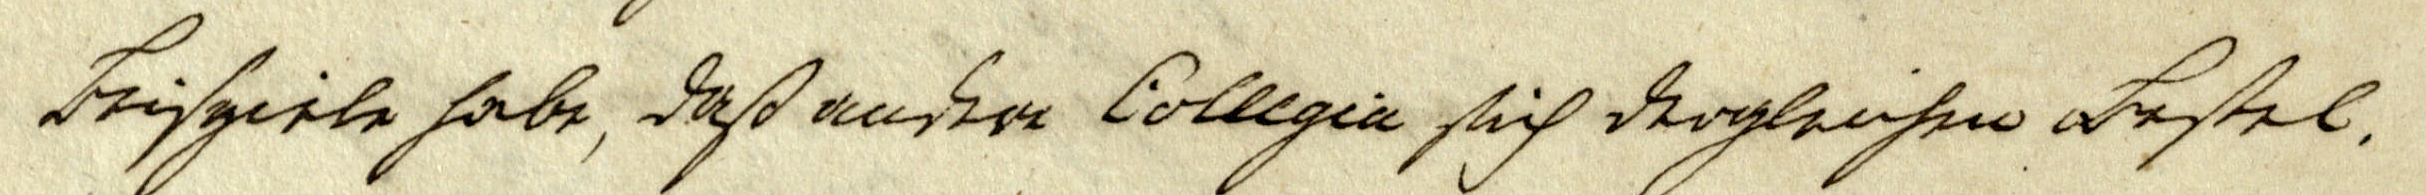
Beispiele habe, daß andere Collegia sich dergleichen Bestel¬
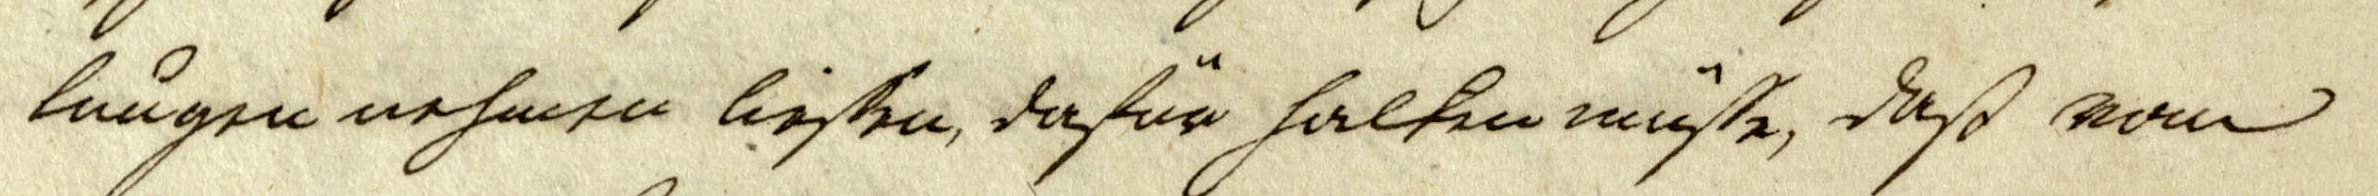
lungen nehmen liessen, dafür halten müsse, daß vom
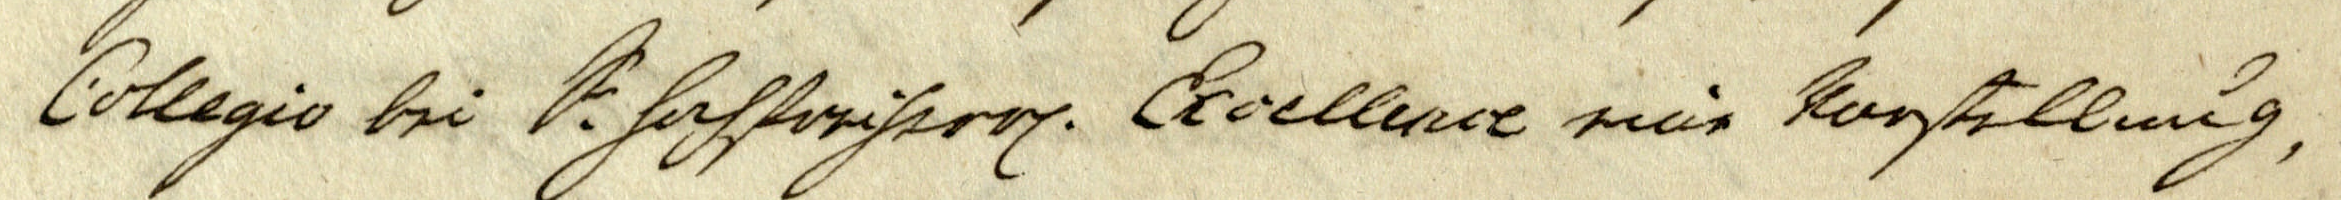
Collegio bei Sr. hochreiherrl. Excellence eine Vorstellung,
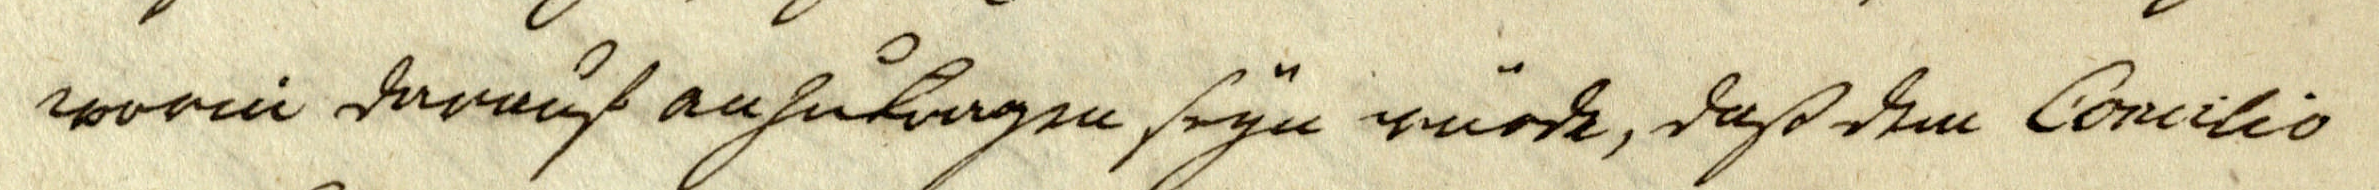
worin darauf anzutragen seÿn würde, daß dem Concilio
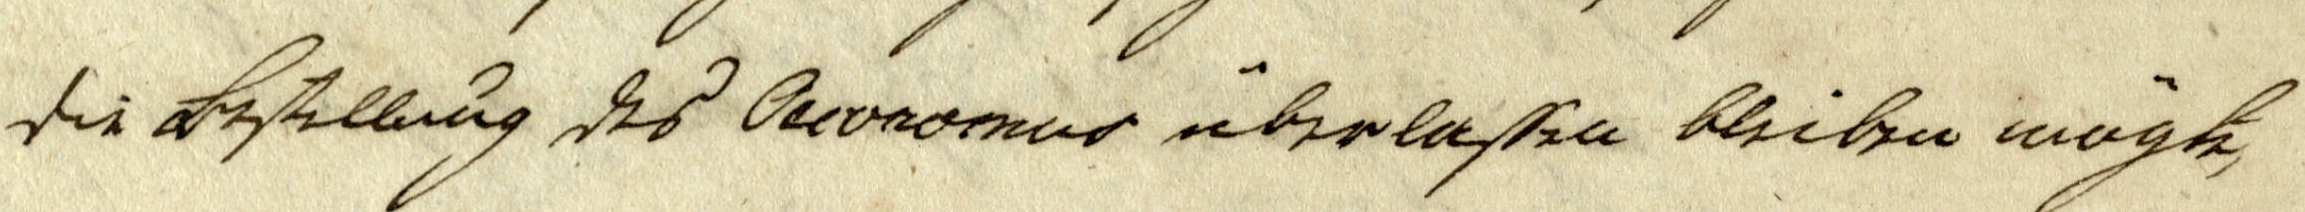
die Bestellung des Oeconomus überlassen bleiben mögte,
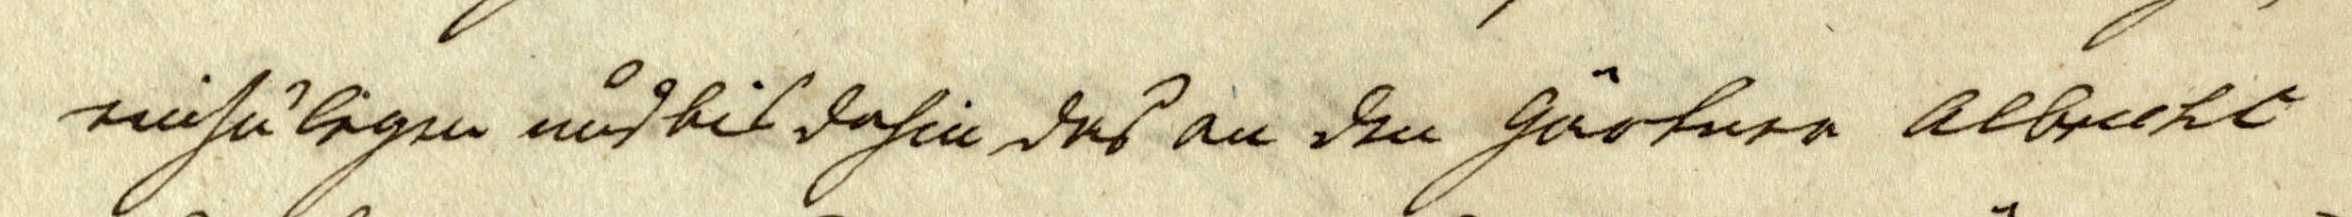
einzulegen und bis dahin das an den Gärtner Albrecht
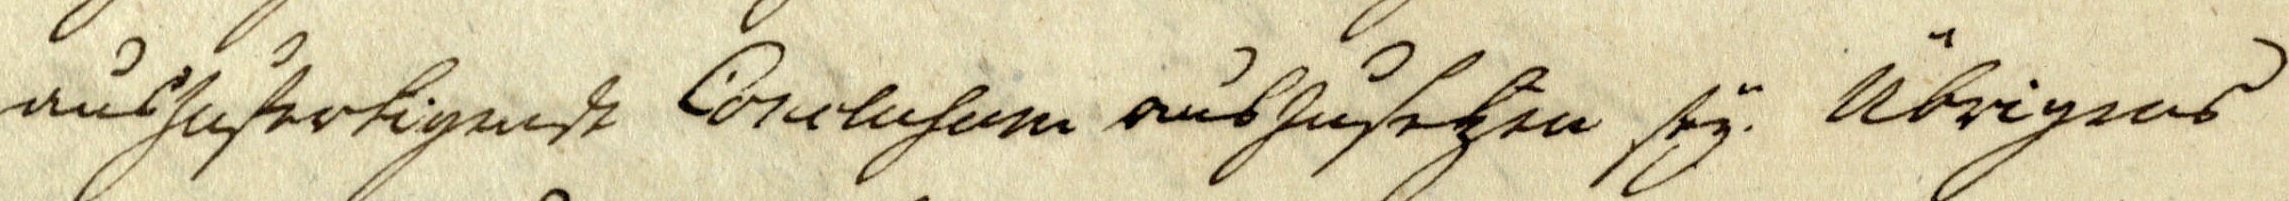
auszufertigende Conclusum auszusetzen seÿ. Übrigens
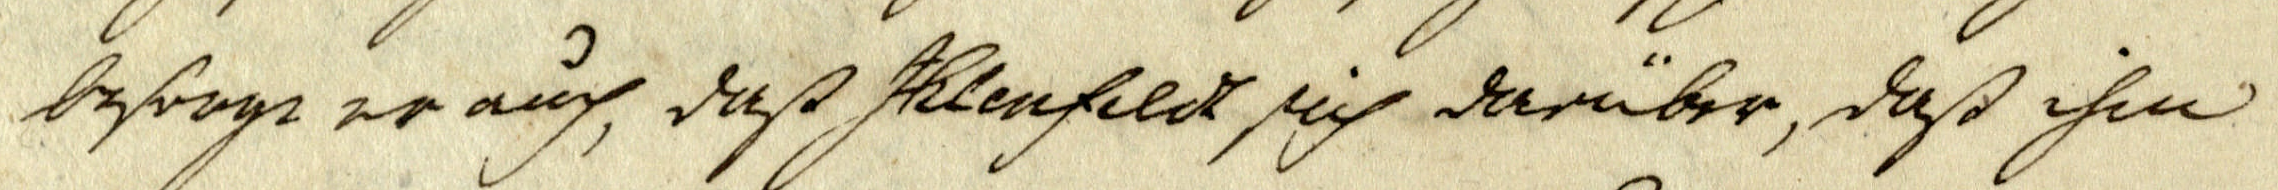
besorge er auch, daß Ihlenfeldt sich darüber, daß ihm
